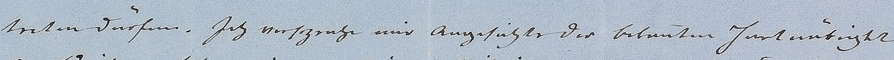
treten dürfen. Ich verspreche mir Angesichts der bekannten Hartnäckigkeit
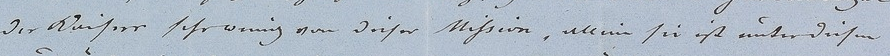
des Kaisers sehr wenig von dieser Mission, allein sie ist unter diesen
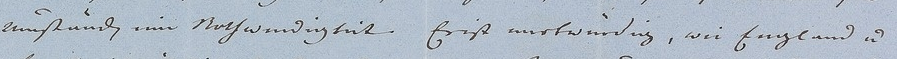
Umständen eine Nothwendigkeit. Es ist merkwürdig, wie England u
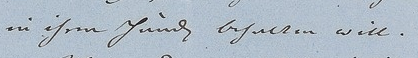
in ihren Händen behalten will. –
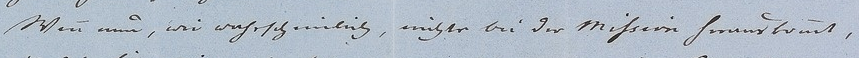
Wenn nun, wie wahrscheinlich, nichts bei der Mission herauskommt,
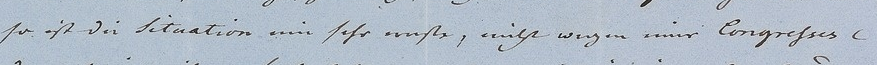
so ist die Situation eine sehr ernste, nicht wegen eines Congresses
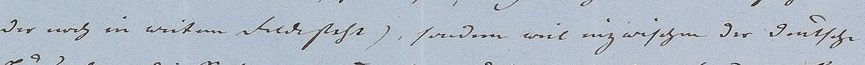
(der noch in weitem Felde steht), sondern weil inzwischen der deutsche
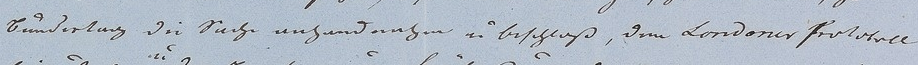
Bundestag die Sache anhand nahm u beschloß, dem Londoner Protokoll
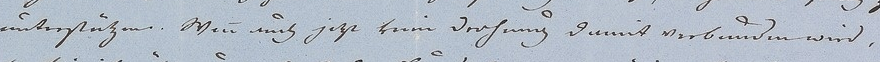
unterstützen. Wenn auch jetzt keine Drohung damit verbunden wird,
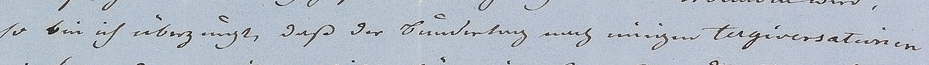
so bin ich überzeugt, daß der Bundestag nach einigen Tergiversationen
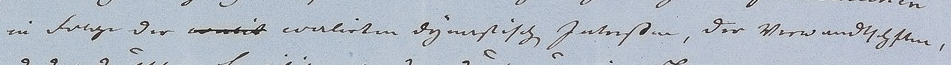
in Folge der ... coalirten dynastischen Intreßen, der Verwandtschaften,
